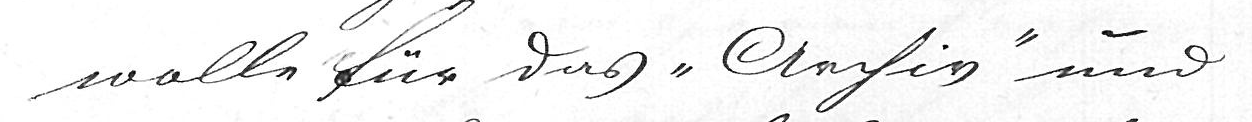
wolle für das "Archiv" und
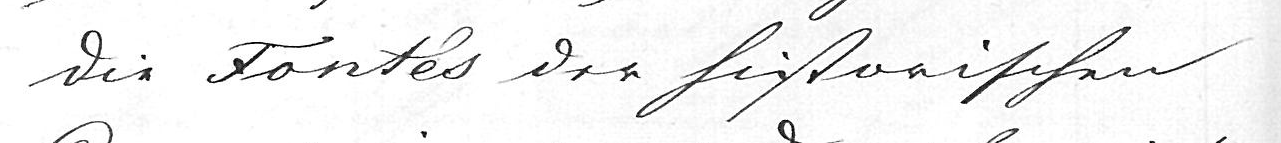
die Fontes der historischen
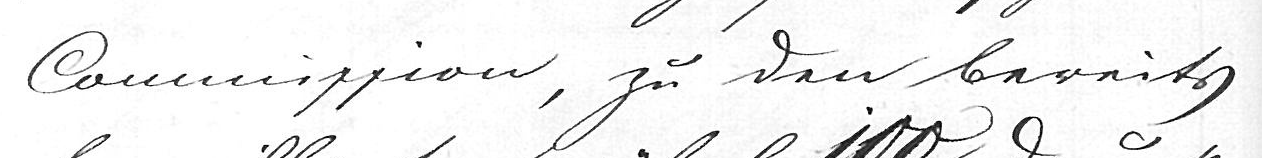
Commission, zu den bereits
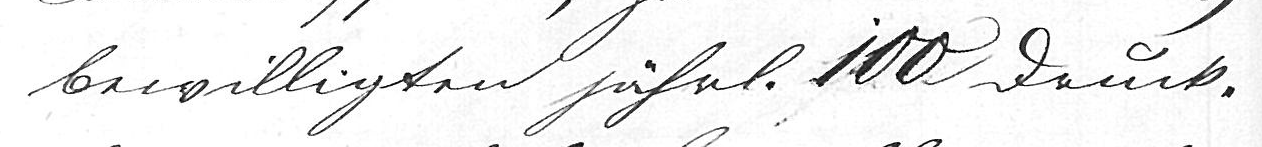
bewilligten jährl. 100 Druck-
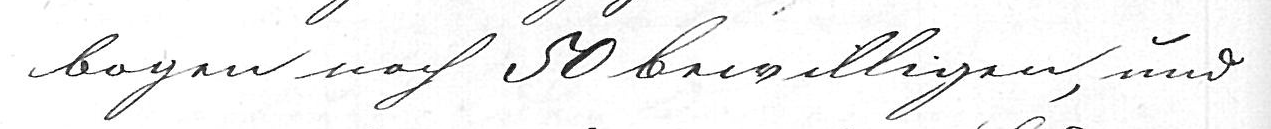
bogen noch 50 bewilligen, und
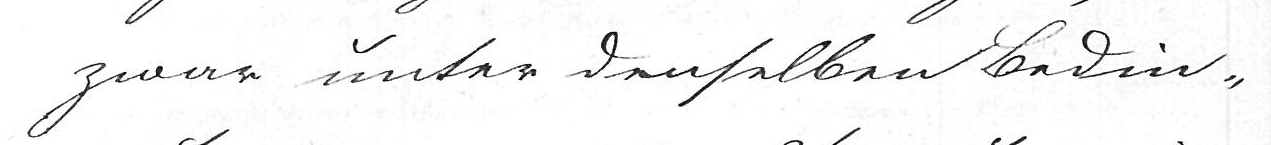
zwar unter denselben Bedin-
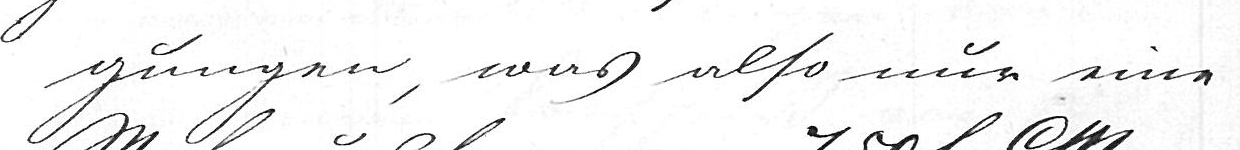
gungen, was also nur eine
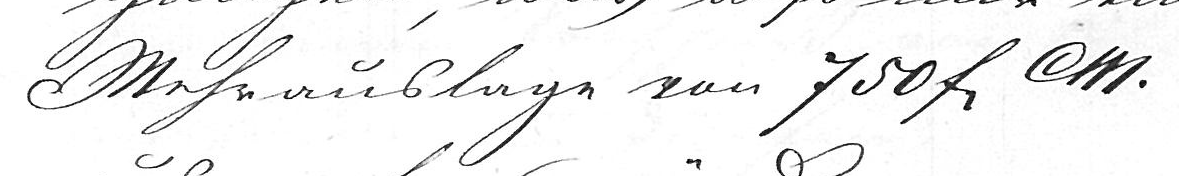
Mehrauslage von 750 fl CM.
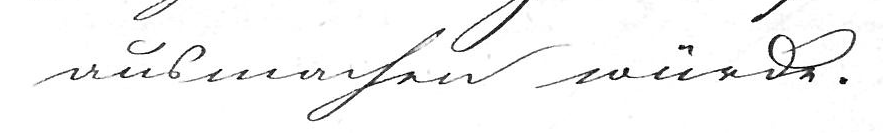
ausmachen würde.
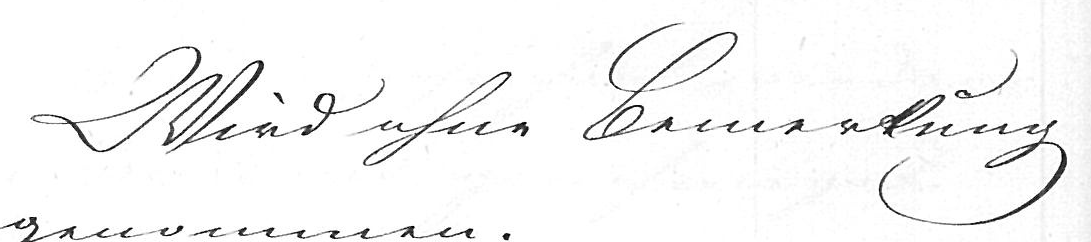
Wie ohne Bemerkung
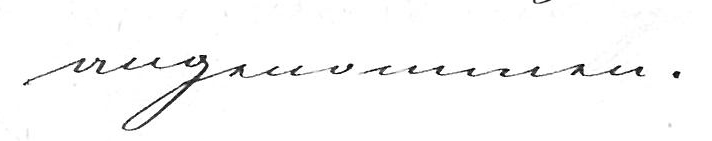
angenommen.
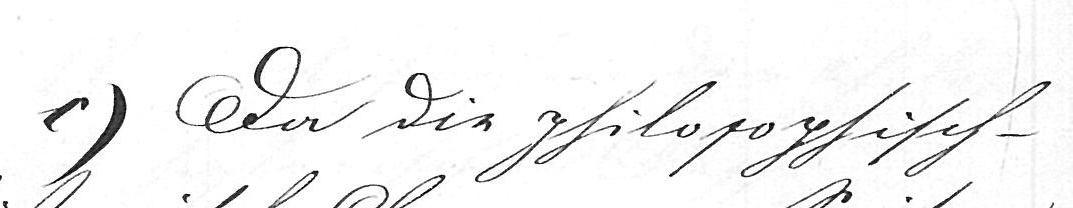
c) Da die philosophisch-
